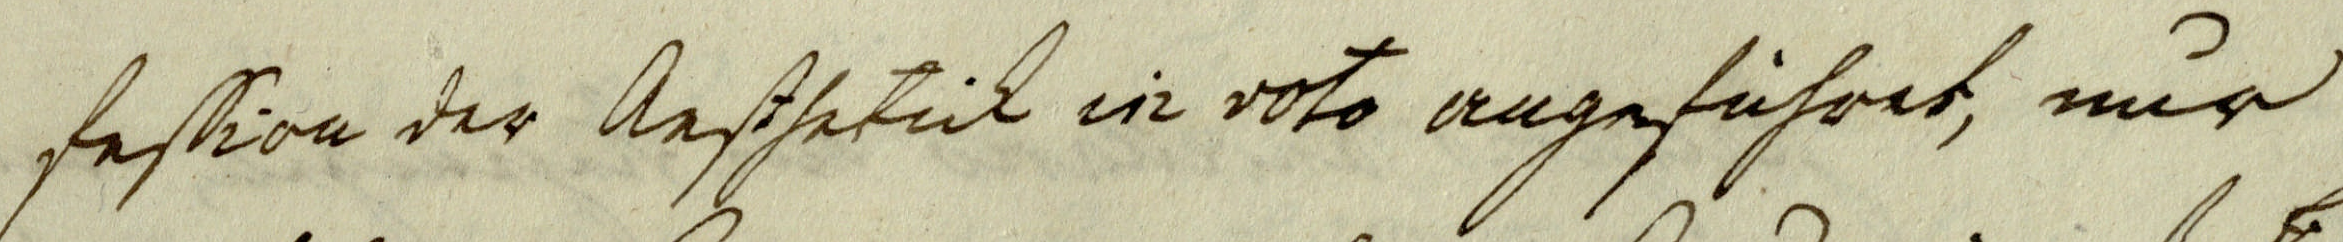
fession der Aesthetick in voto angeführet, nur
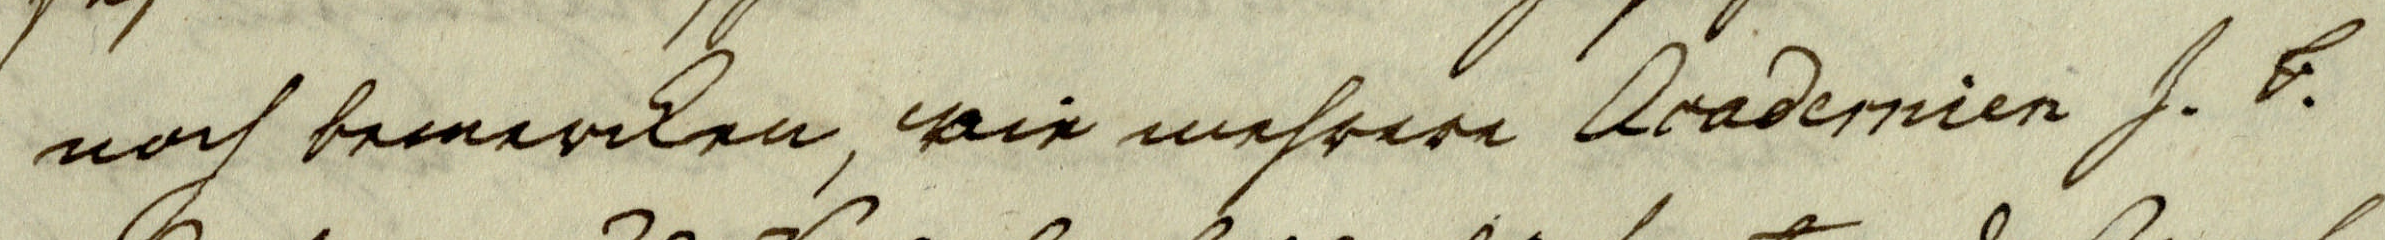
noch bemerken, wie mehrere Academien z.B.
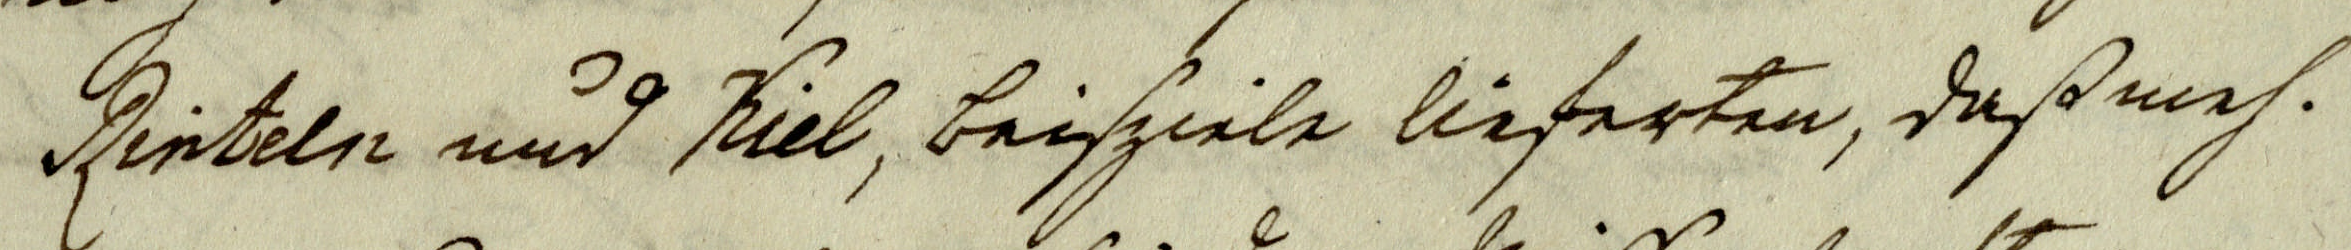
Rinteln und Kiel, Beispiele lieferten, daß meh¬
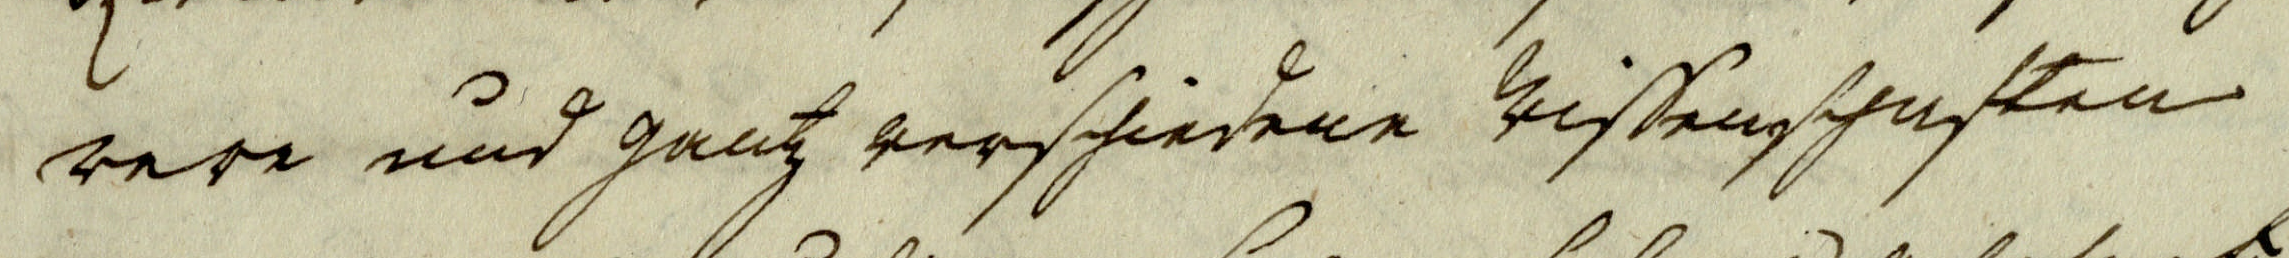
rere und gantz verschiedene Wissenschaften
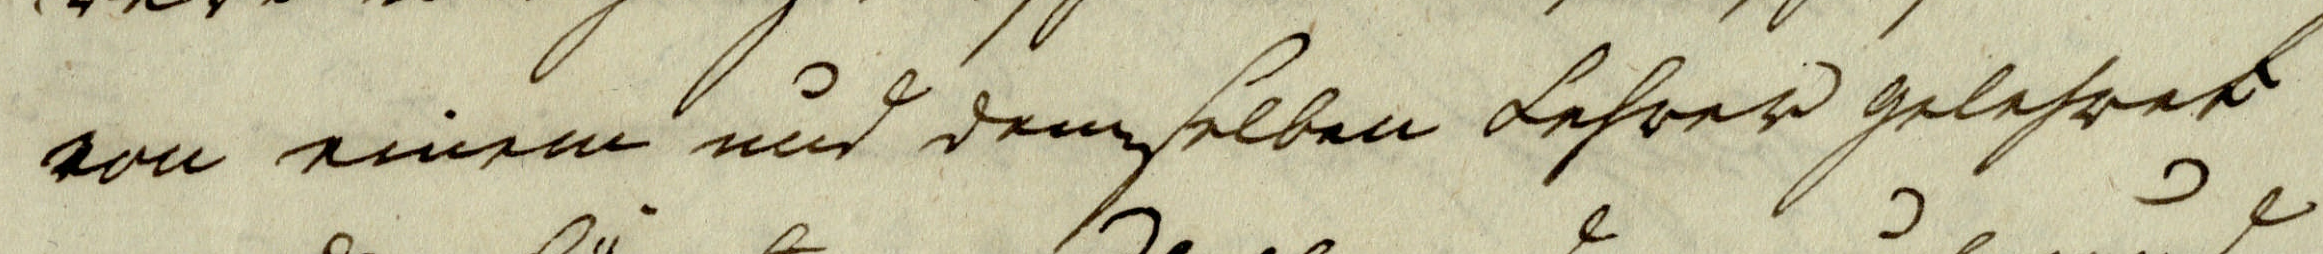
von einem und demselben Lehrer gelehret
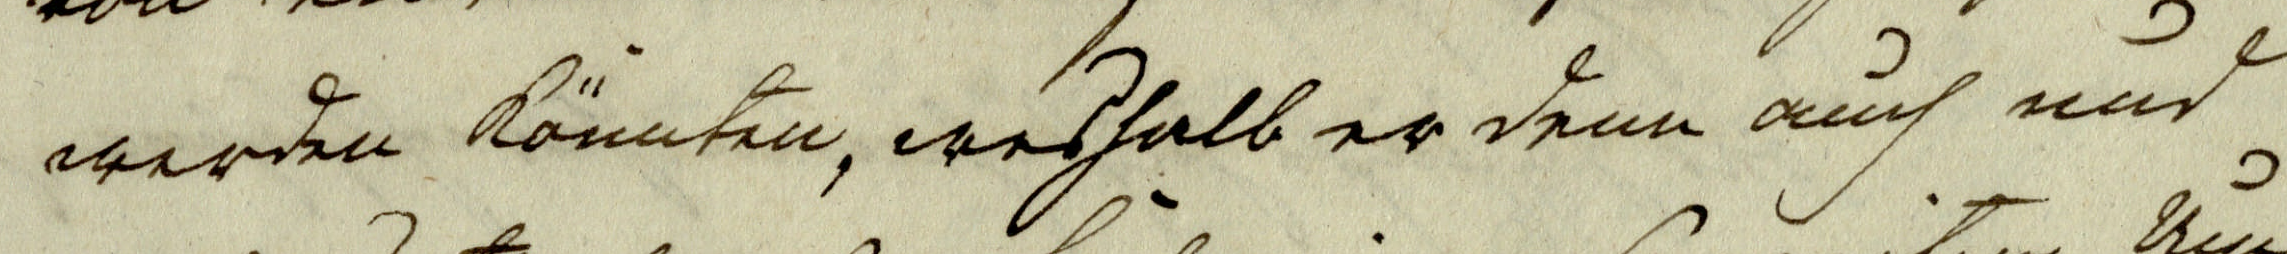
werden könnten, weshalb er denn auch und
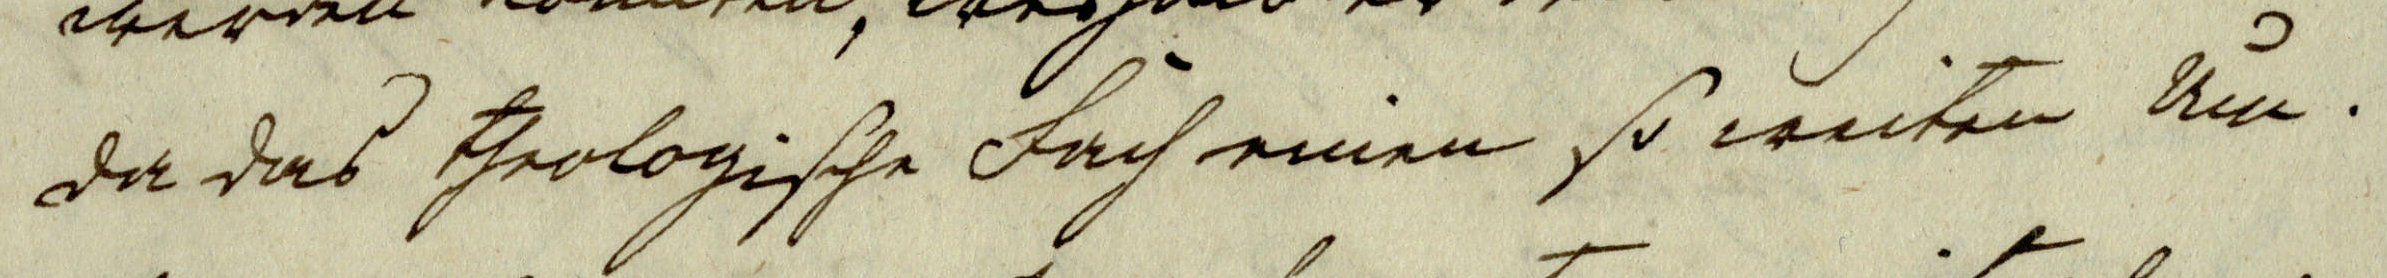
da das theologische Fach einen so weiten Um¬
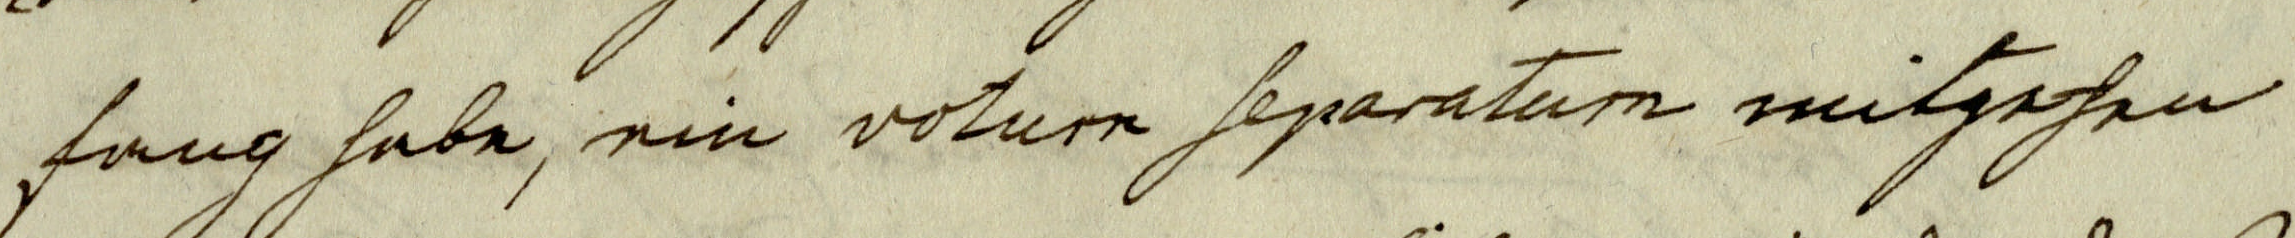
fang habe, ein votum separatum mitgehen
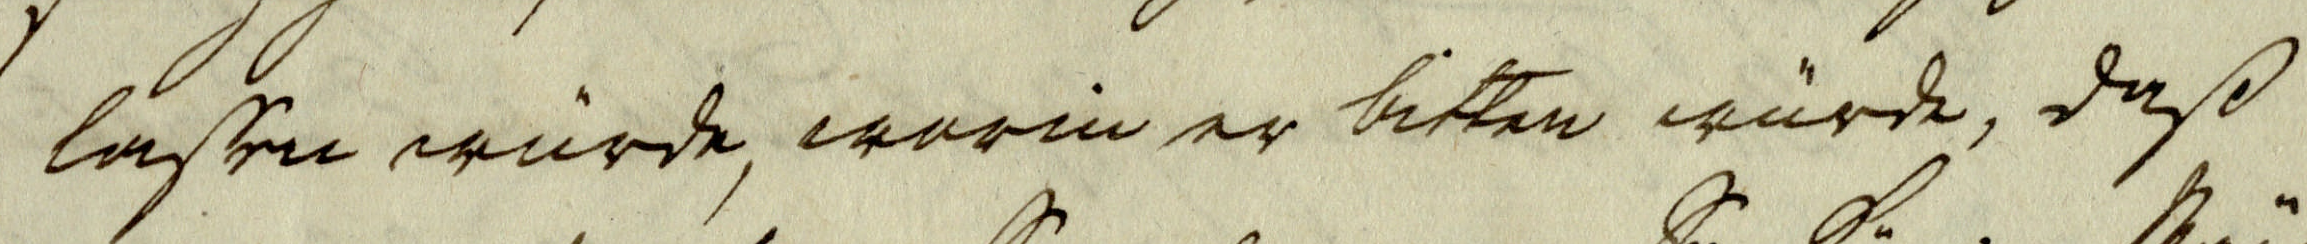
lassen würde, worin er bitten würde, daß
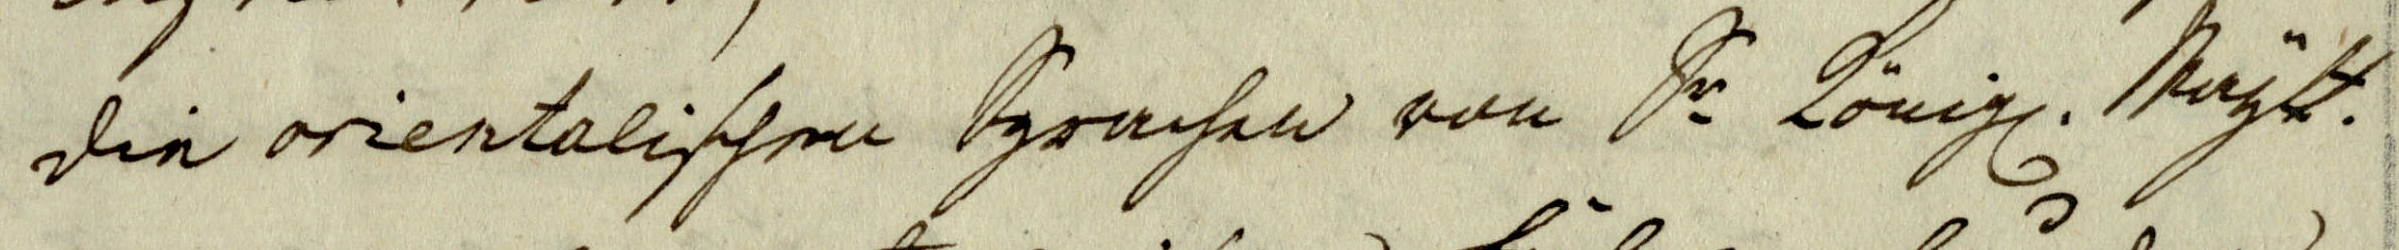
die orientalischen Sprachen von Sr. Königl. Maÿst.
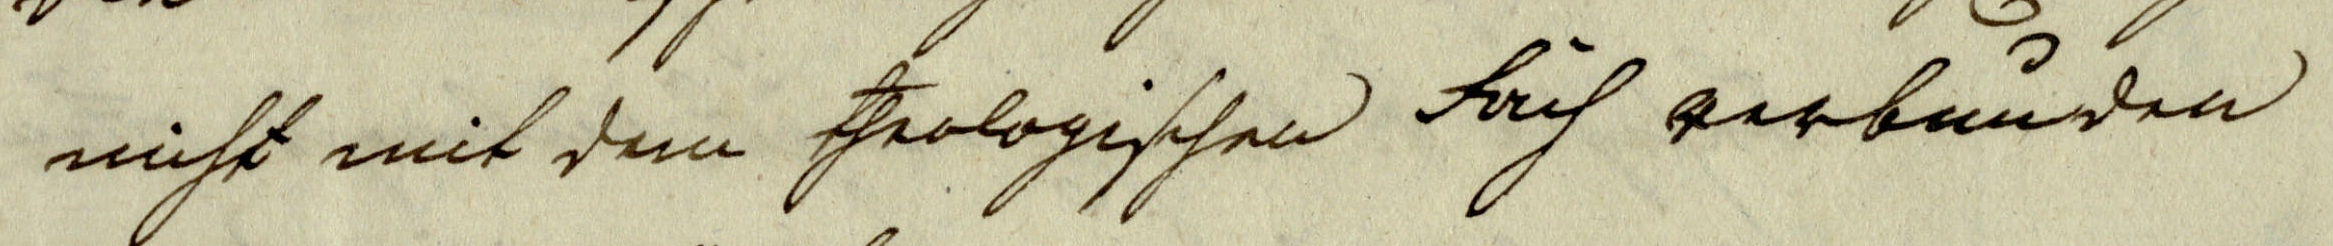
nicht mit dem theologischen Fach verbunden
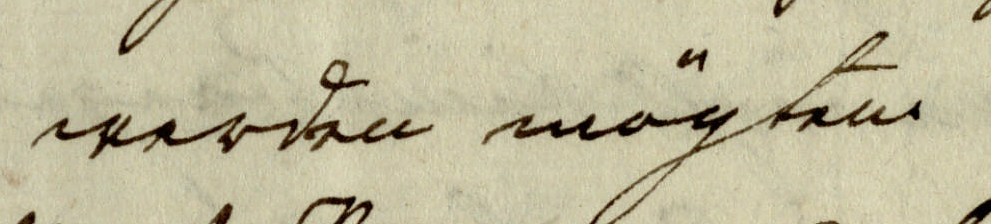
werden mögten.
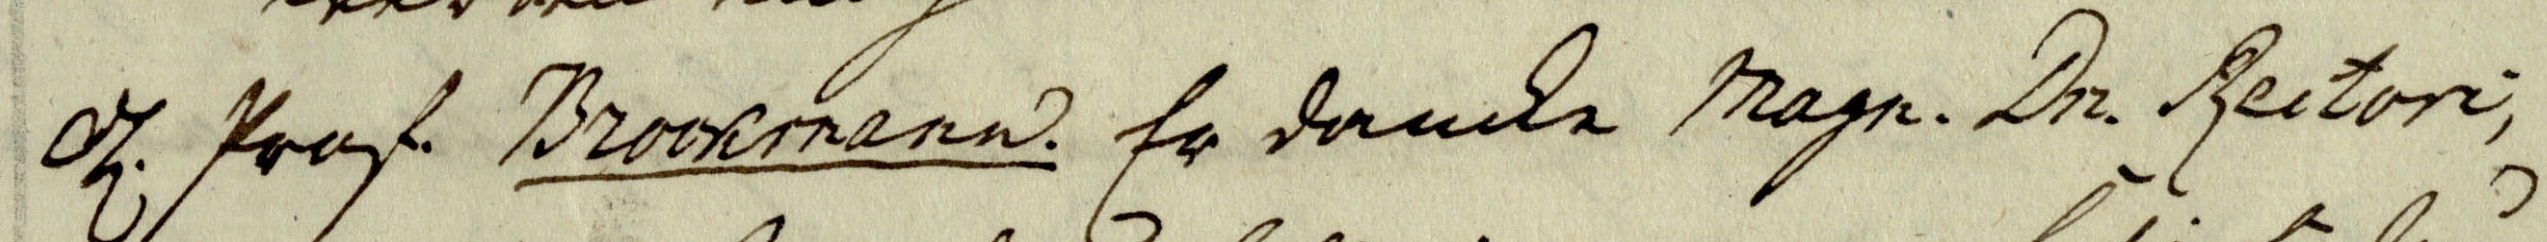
dh. Prof. Brockmann. Er danke Magn. Dn. Rectori,
